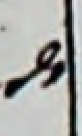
do
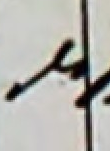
do
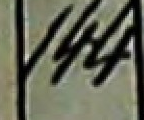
144
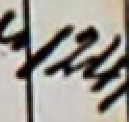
124
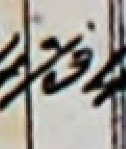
734
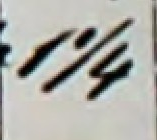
1 1/4
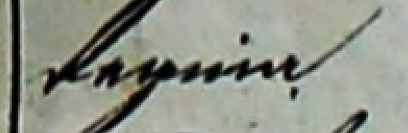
Regina
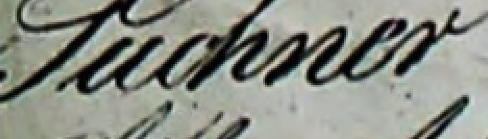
Puchner
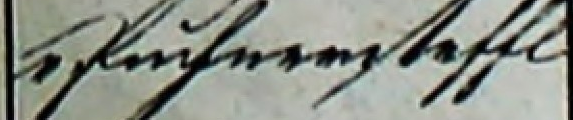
v. Puchnersteffl
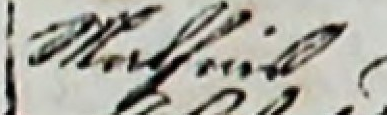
Mathias
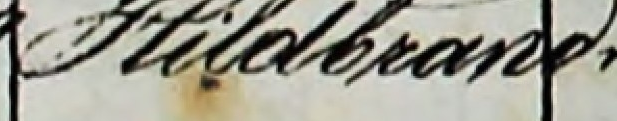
Hildbrand
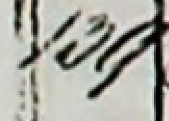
139
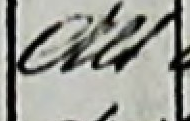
Alt
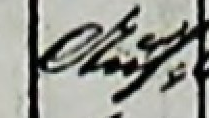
Aus„
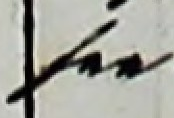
see
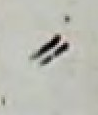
„
